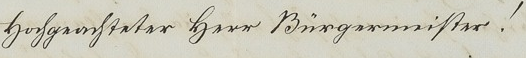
Hochgeachteter Herr Bürgermeister!
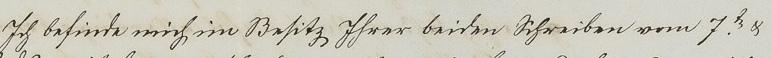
Ich befinde mich im Besitz Ihrer beiden Schreiben vom 7ten .
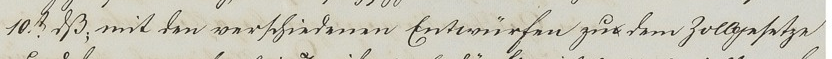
10ten. dß ; mit den verschiedenen Entwürfen zu dem Zollgesetze
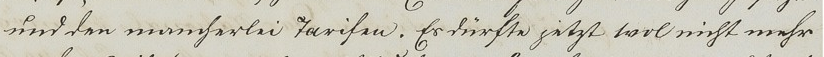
und den mancherlei Tarifen. Es dürfte jetzt wol nicht mehr
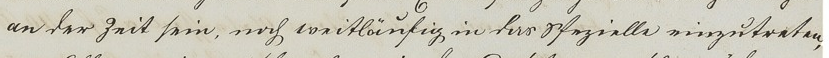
an der Zeit sein, noch weitläufig in das Spezielle einzutreten,
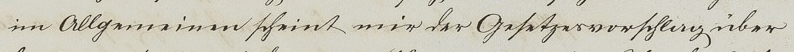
im Allgemeinen scheint mir der Gesetzesvorschlag über
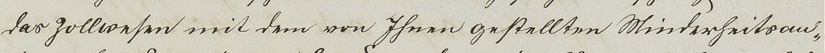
das Zollwesen mit dem von Ihnen gestellten Minderheitsan-
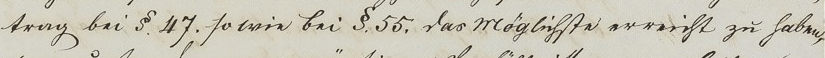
trag bei §. 47. so wie bei §. 55. das Möglichste erreicht zu haben,
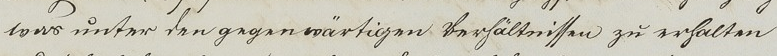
was unter den gegenwärtigen Verhältnissen zu erhalten
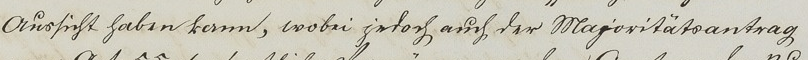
Aussicht haben kann, wobei jedoch auch der Majoritätsantrag
